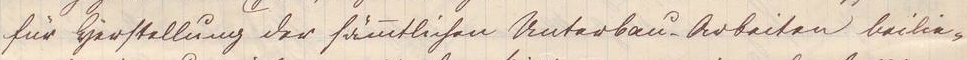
für Herstellung der sämmtlichen Unterbau-Arbeiten beilie-
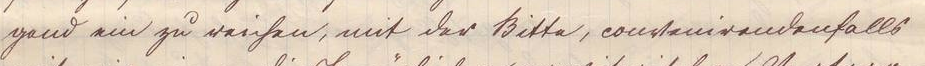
gend ein zu reichen, mit der Bitte, convenirendenfalls
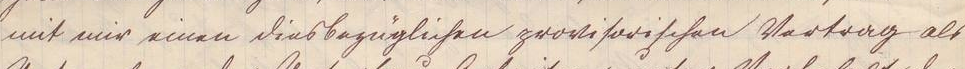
mit mir einen diesbezüglichen provisorischen Vertrag als
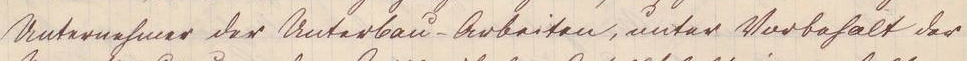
Unternehmer der Unterbau-Arbeiten, unter Vorbehalt der
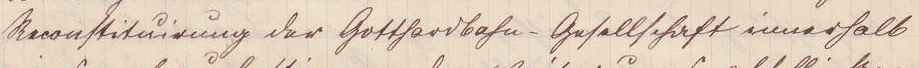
Reconstituirung der Gotthardbahn-Gesellschaft innerhalb
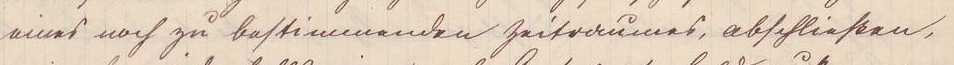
eines noch zu bestimmenden Zeitraumes, abschließen,
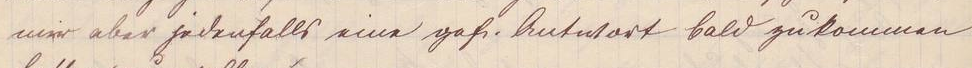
mir aber jedenfalls eine gef. Antwort bald zukommen
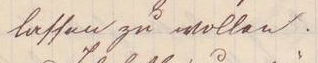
lassen zu wollen.
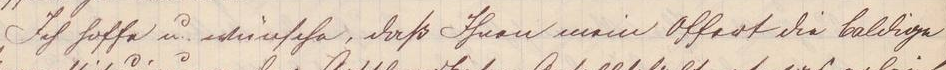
Ich hoffe u. wünsche, daß Ihnen mein Offert die baldige
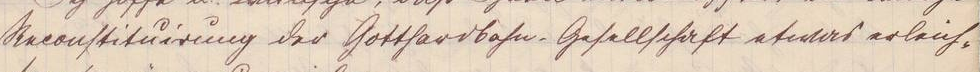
Reconstituirung der Gotthardbahn-Gesellschaft etwas erleich-
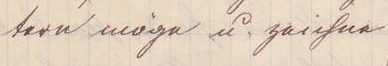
tern möge u. zeichne
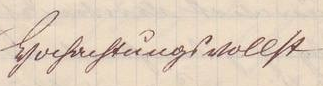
Hochachtungsvollst
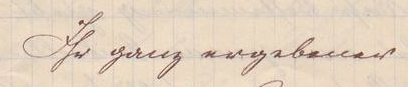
Ihr ganz ergebener
